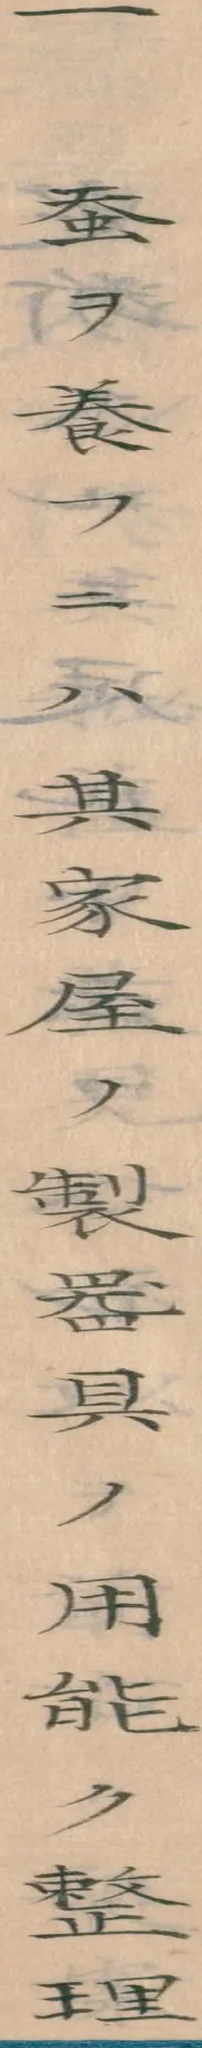一蚕ヲ養フニハ其家屋ノ製器具ノ用能ク整理
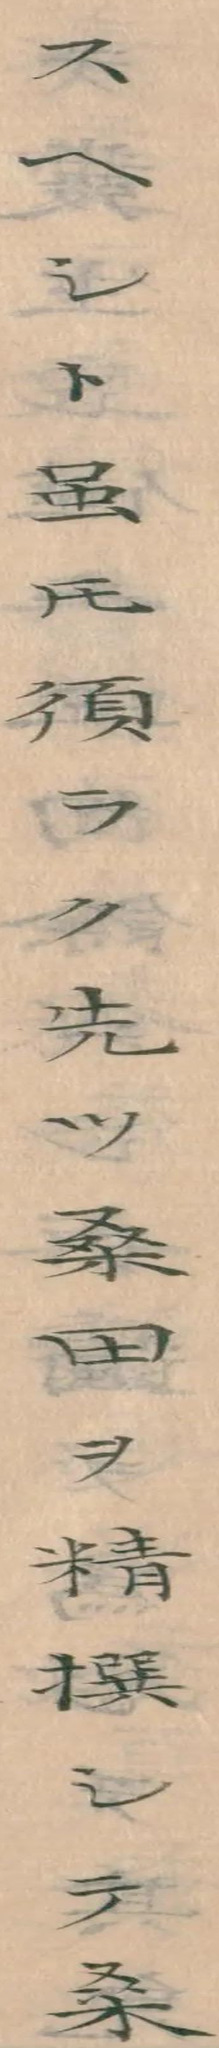スヘシト虽トモ須ラク先ツ桑田ヲ精撰シテ桑
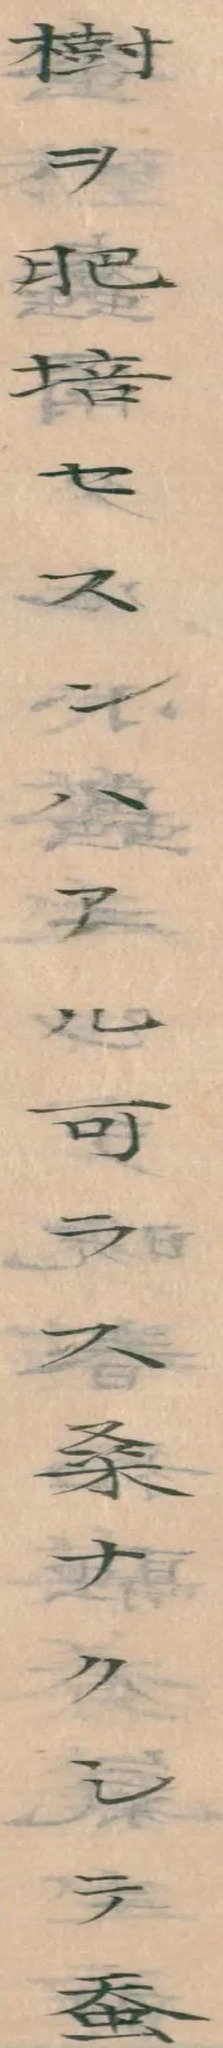樹ヲ肥培セスンハアル可ラス桑ナクシテ蚕
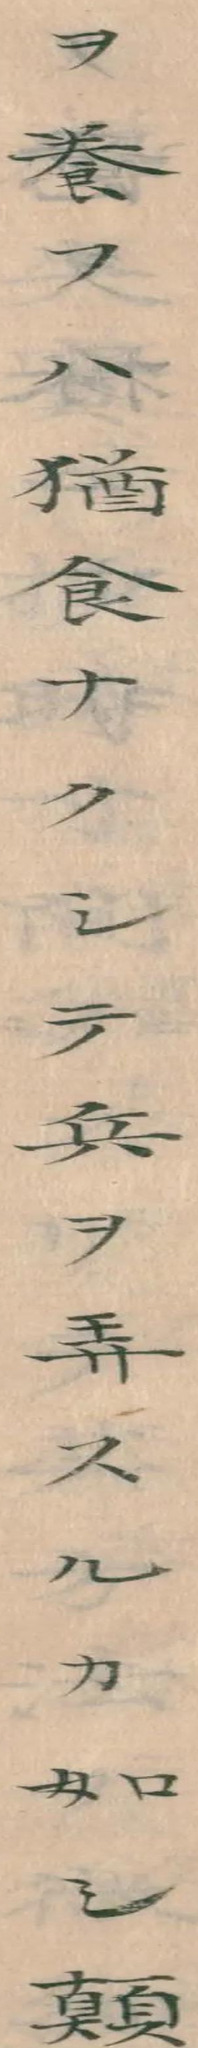ヲ養フハ猶食ナクシテ兵ヲ弄スルカ如シ顛
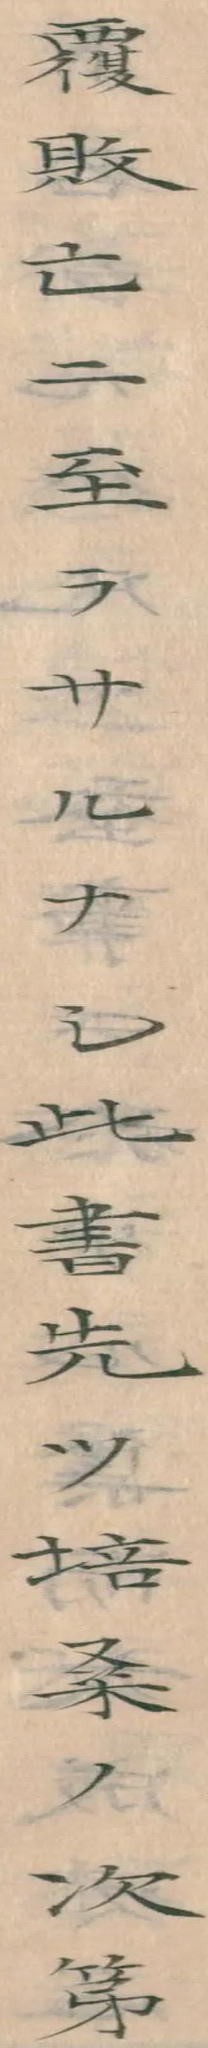覆敗亡ニ至ラサルナシ此書先ツ培桑ノ次第
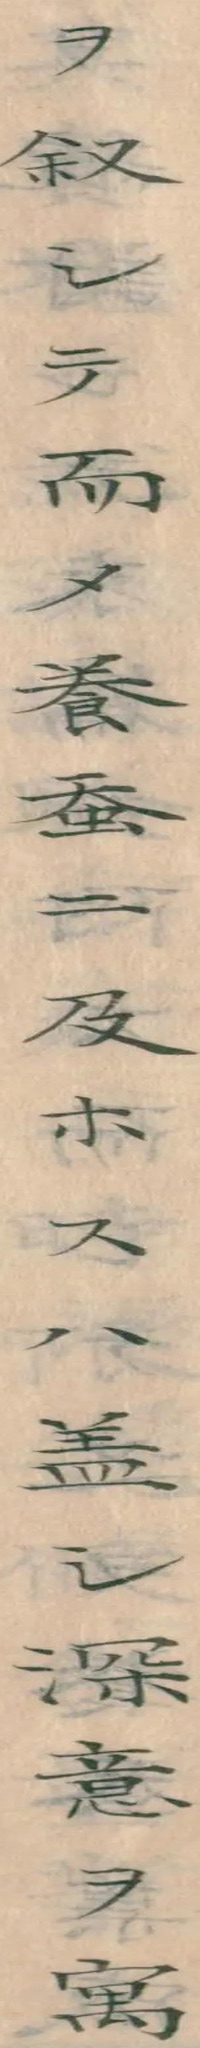ヲ叙シテ而シテ養蚕ニ及ホスハ蓋シ深意ヲ寓
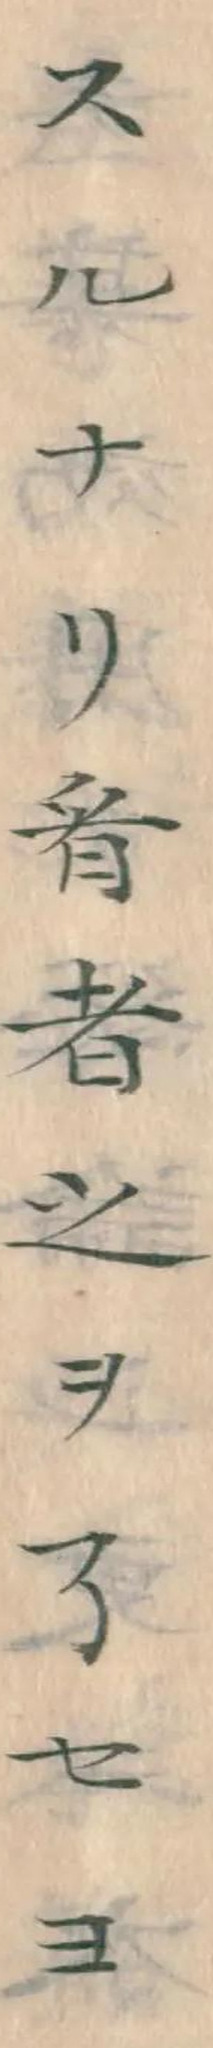スルナリ看者之ヲ了セヨ
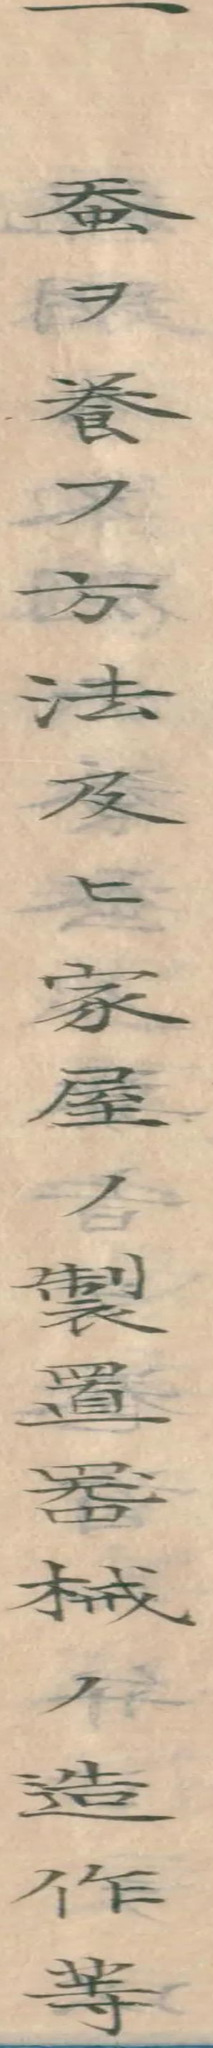一蚕ヲ養フ方法及ヒ家屋ノ製置器械ノ造作等
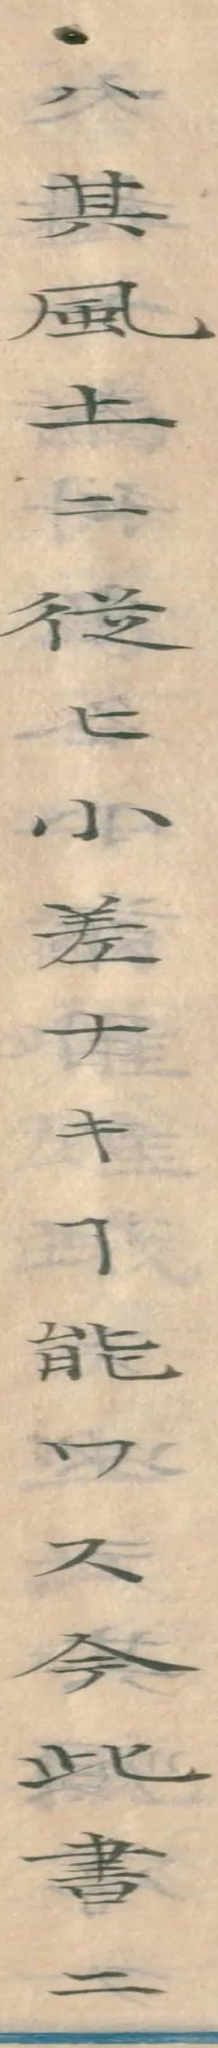ハ其風土ニ従ヒ小差ナキコト能ワス今此書ニ
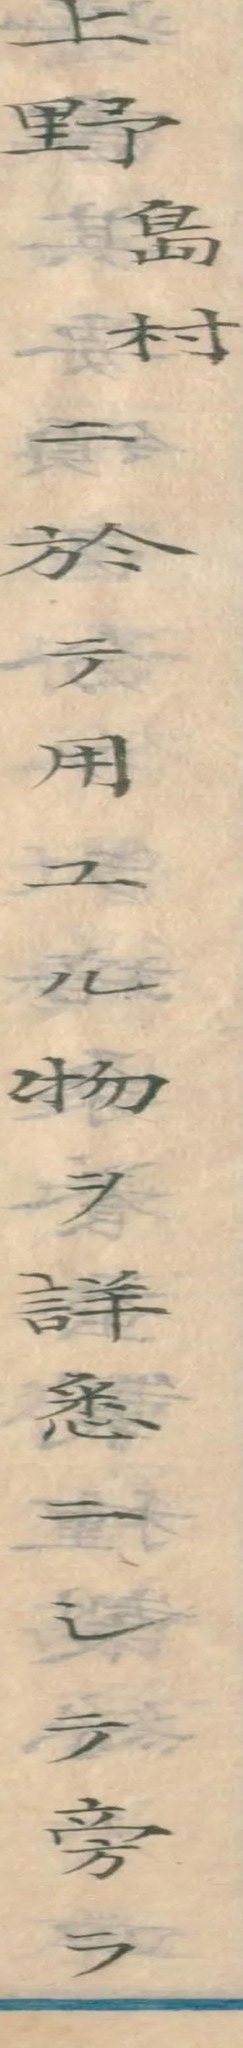上野島村ニ於テ用ユル物ヲ詳悉ニシテ旁ラ
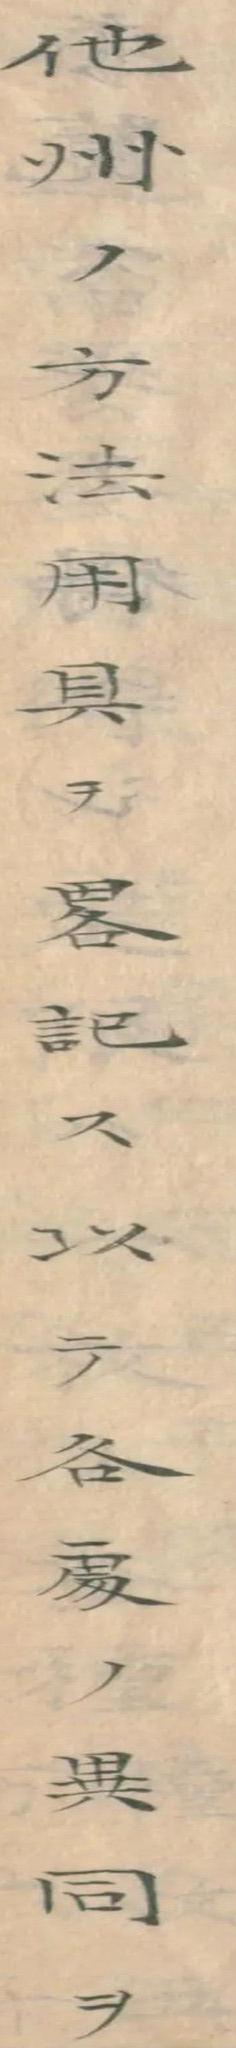他州ノ方法用具ヲ略記ス以テ各処ノ異同ヲ

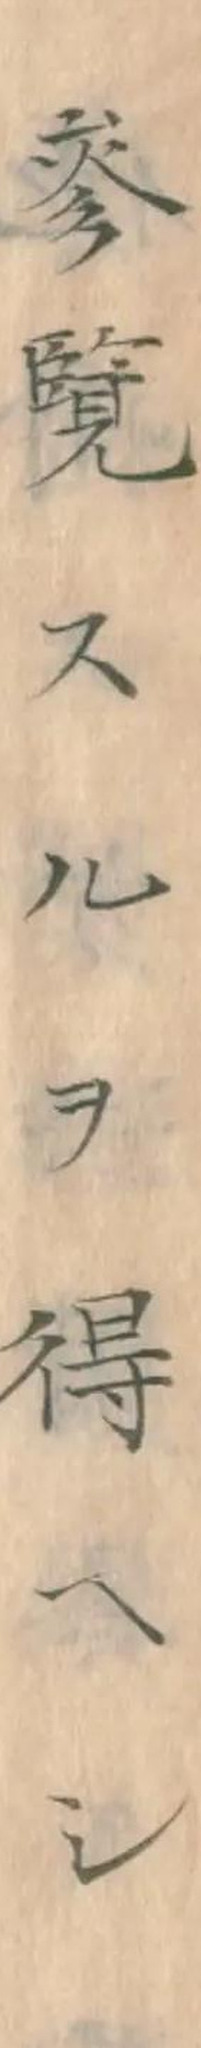参覧スルヲ得ヘシ
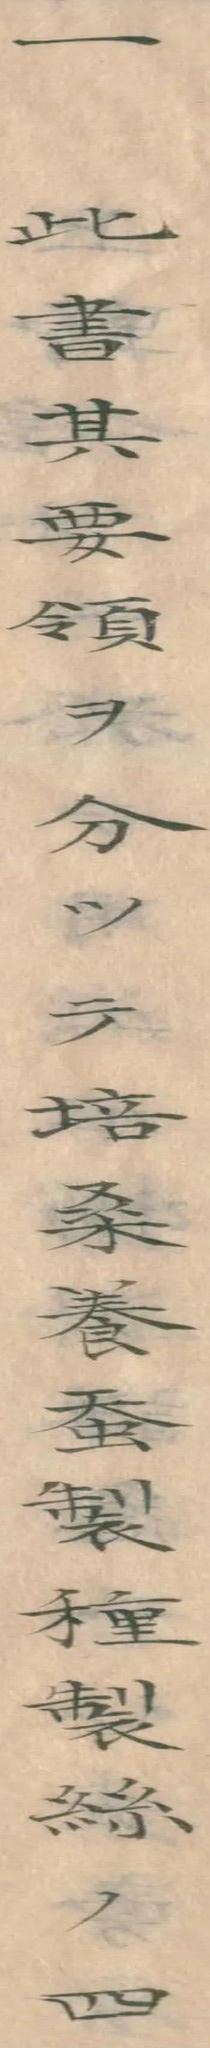一此書其要領ヲ分ツテ培桑養蚕製種製糸ノ四
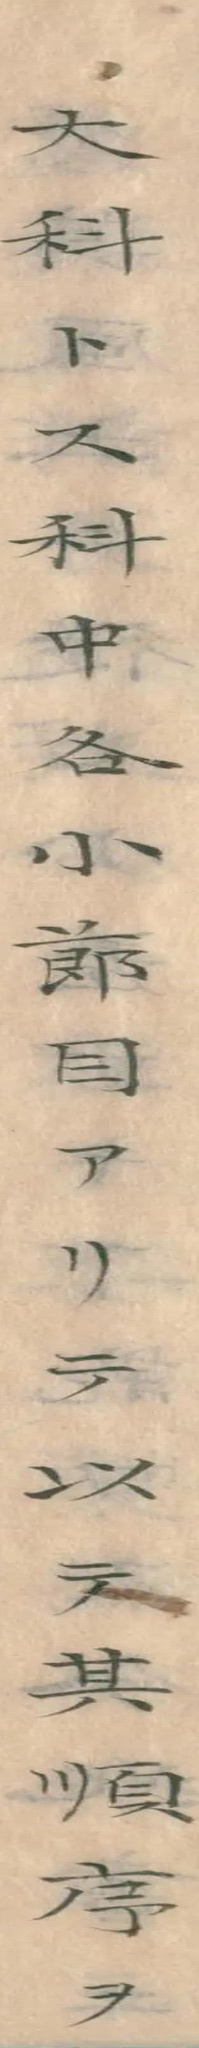大科トス科中各小節目アリテ以テ其順序ヲ
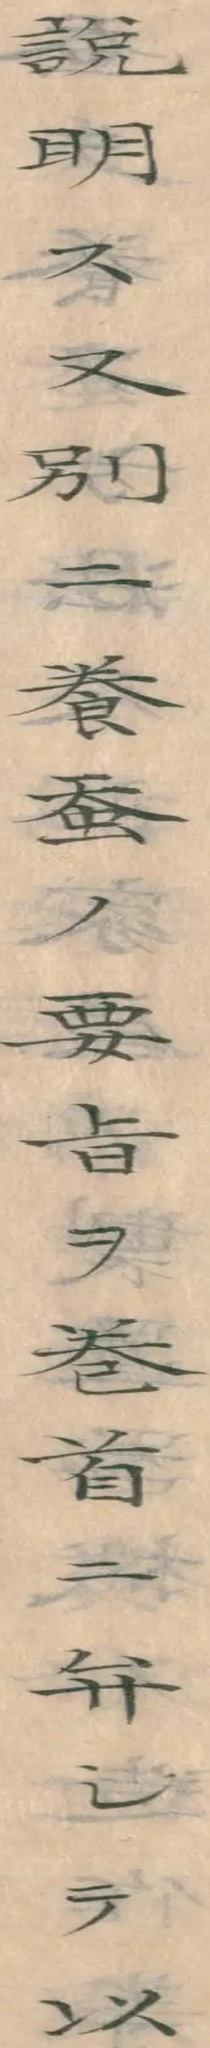説明ス又別ニ養蚕ノ要旨ヲ巻首ニ弁シテ以
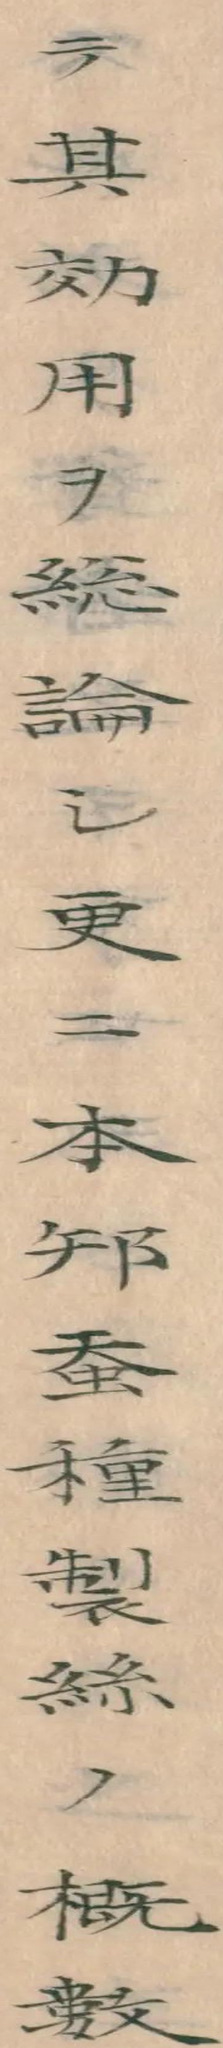テ其効用ヲ総論シ更ニ本邦蚕種製糸ノ概数
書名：蚕桑集成
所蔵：国立国会図書館 National Diet Library, JAPAN
